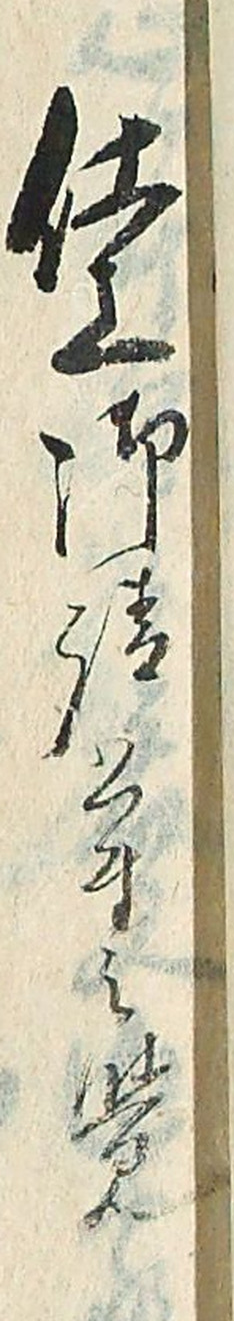仕上御請書付の覚
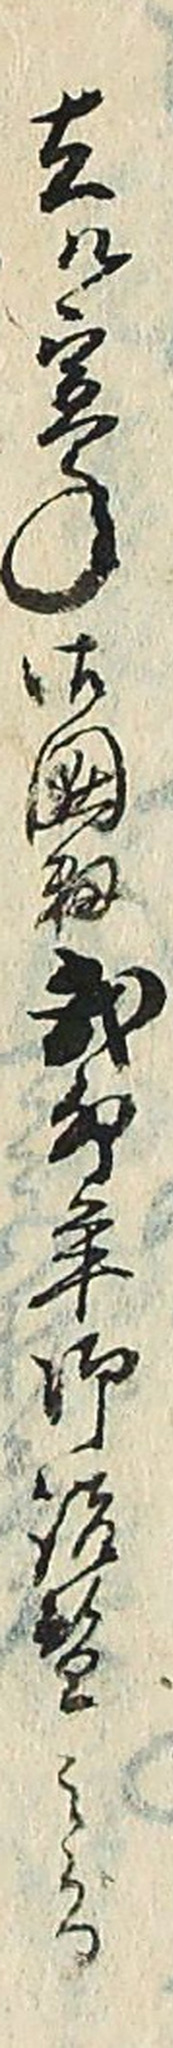去ル寅年御囲籾当卯年御詰替之分
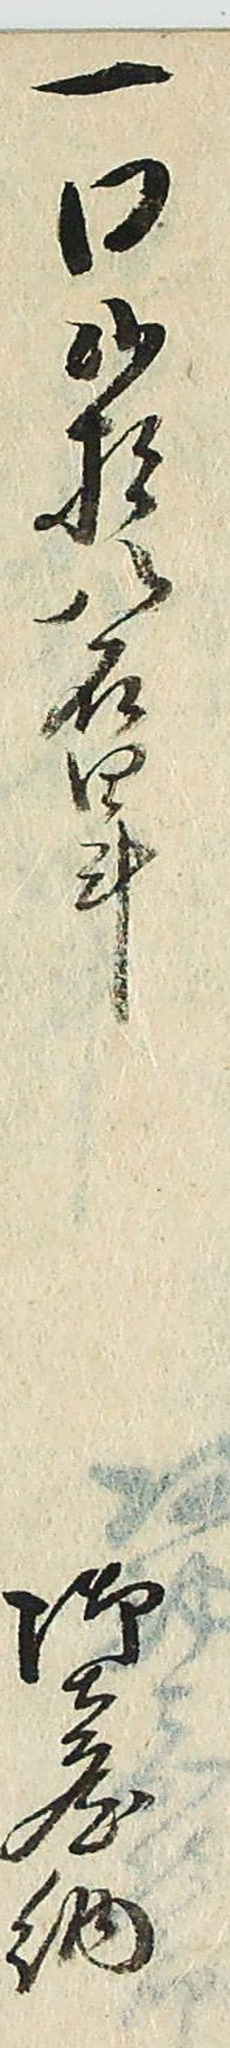一同弐拾八石四斗御土蔵納
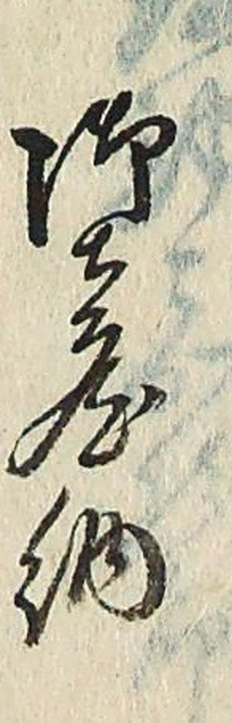御土蔵納
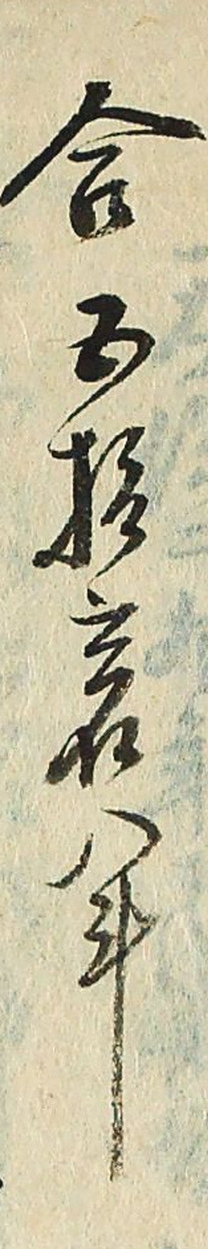合五拾六石八斗
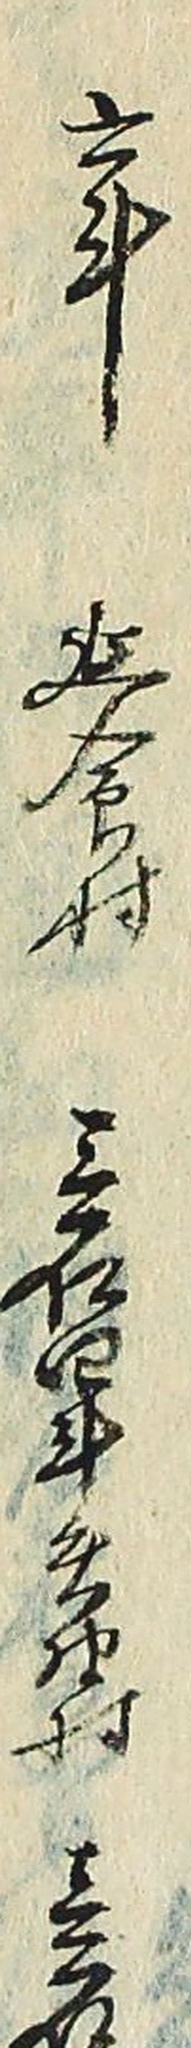六斗延命村三石四斗矢野村
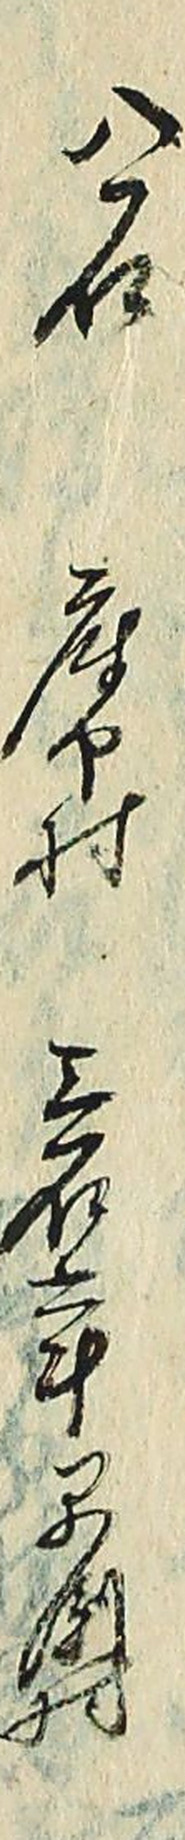八石府中村三石六斗早渕村お
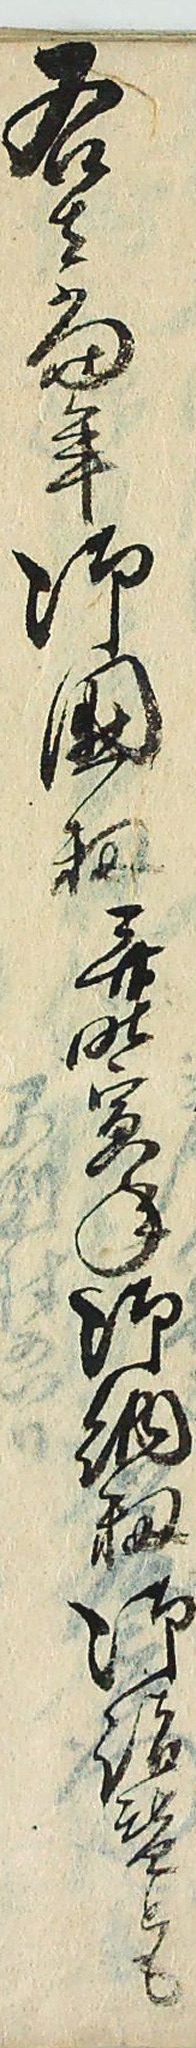右者当年御囲籾幷昨寅年御納籾御詰替とも
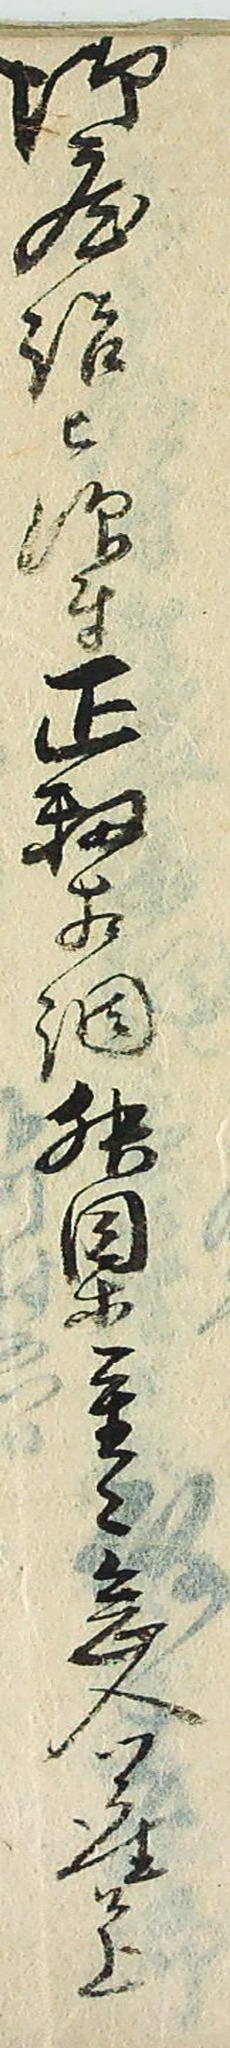御蔵詰被仰付正籾相調升目等重々念入御座候上
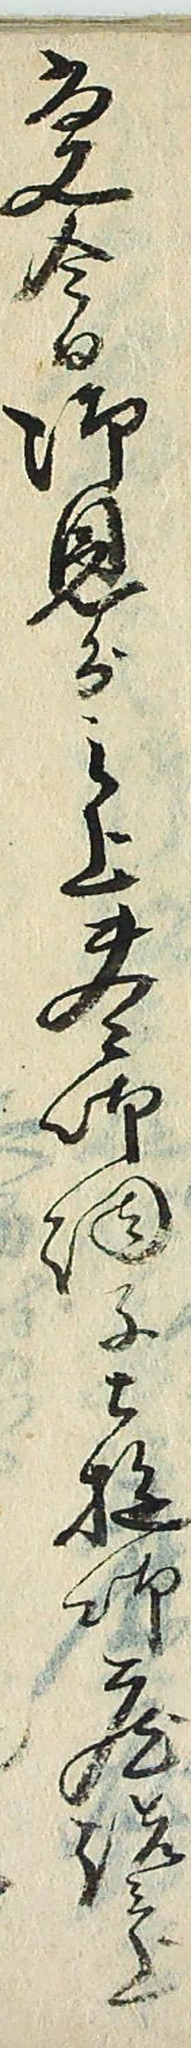尚又今日御見分之上夫々御調子被遊御蔵詰之上
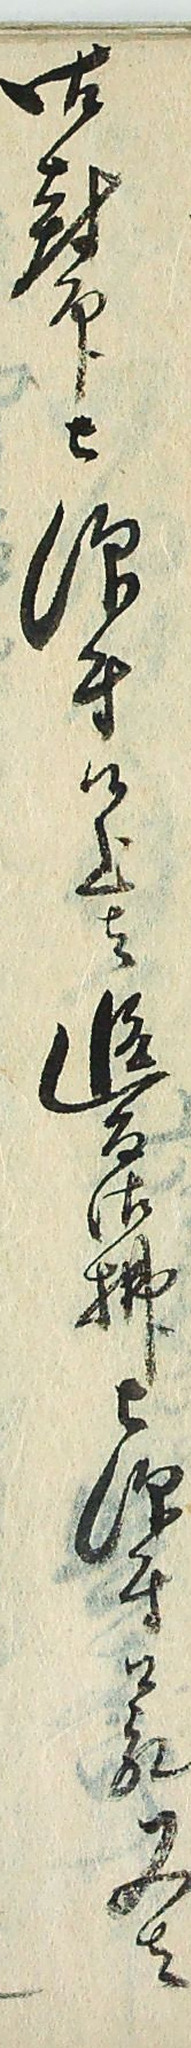御封印被仰付候上者追而御払被仰付候哉歟又者
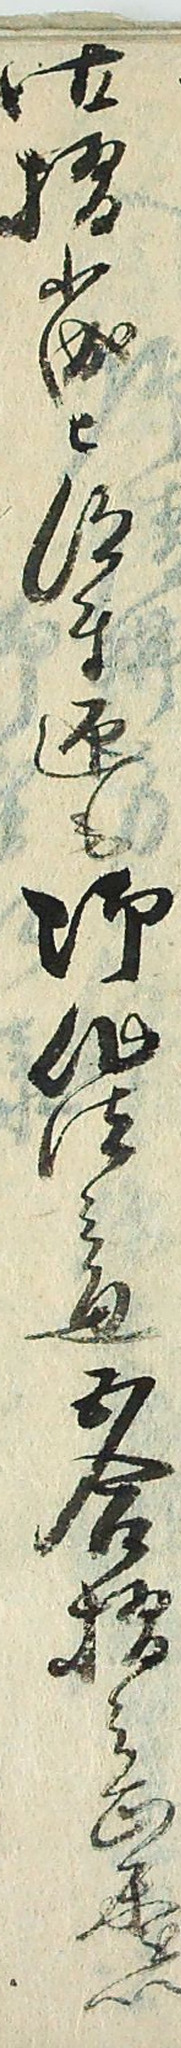御摺小成被仰付迎も御作法之通五合摺之正米を以
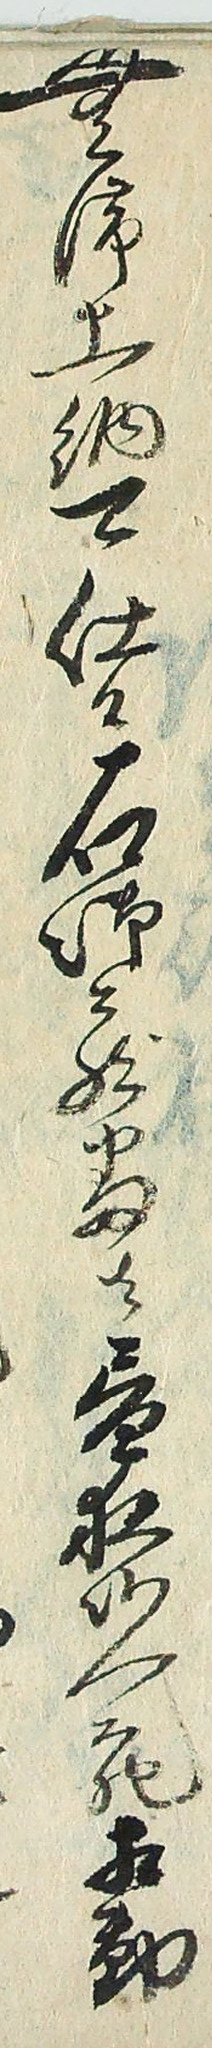無滞上納可仕候右御蔵番者昼夜弐一人宛相勤
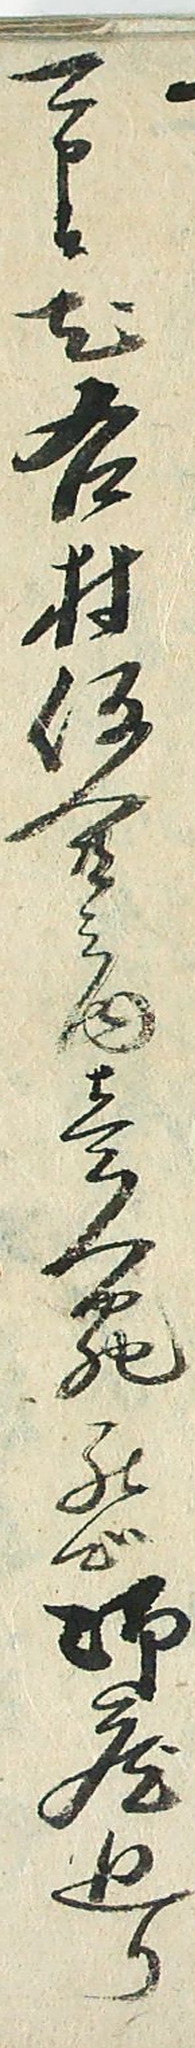可申候尤右村役人共之内壱人宛罷出御蔵廻り
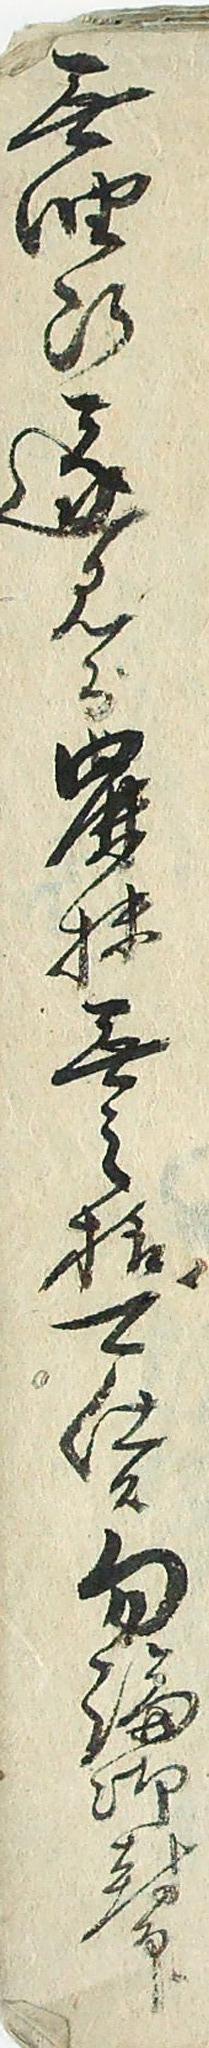無油断遂見分麁抹無之様可仕候勿論御封印

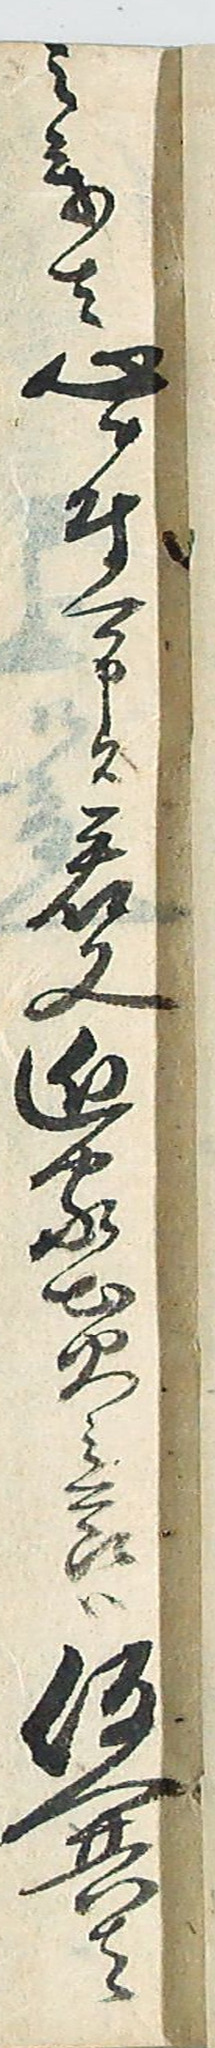之義者心ヲ付可申候若又近家出火之節は役人共者
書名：諸御用御□受書控
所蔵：鳴門教育大学 Naruto University of Education
